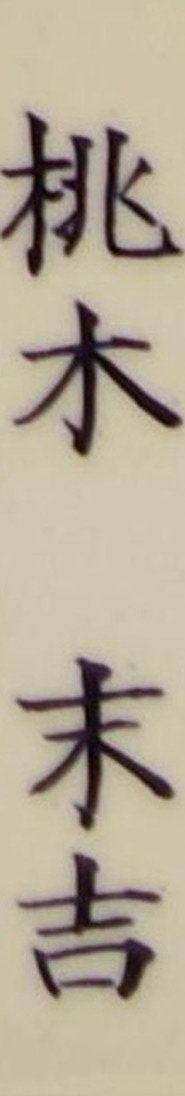桃木末吉
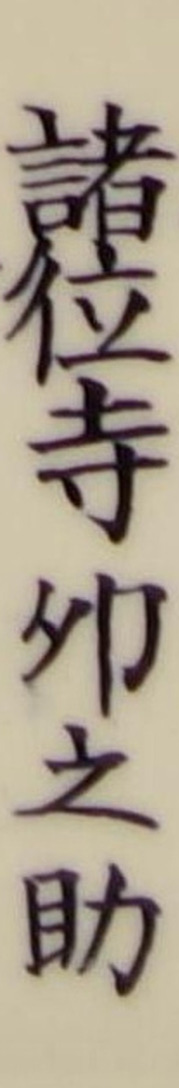諸位寺卯之助
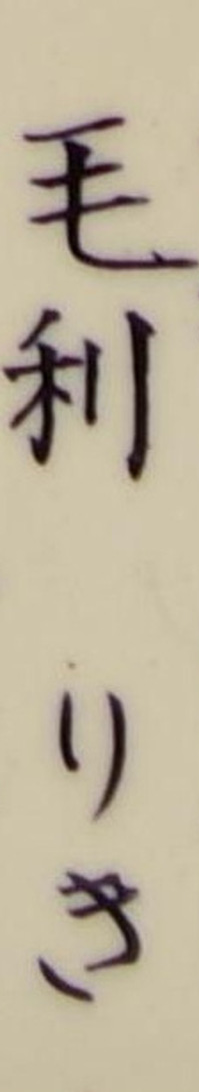毛利りき
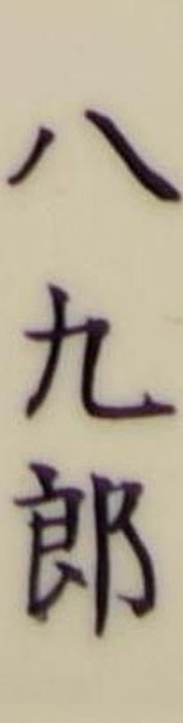八九郎
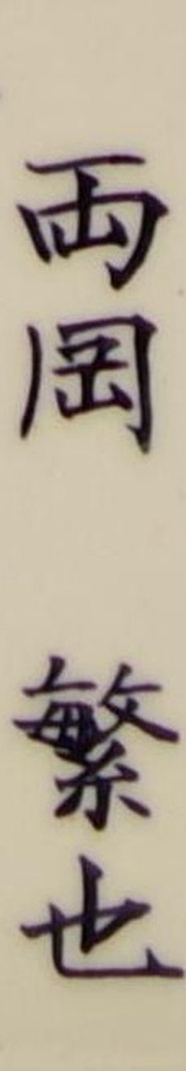両岡繁也
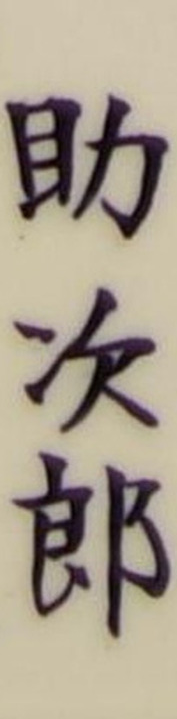助次郎
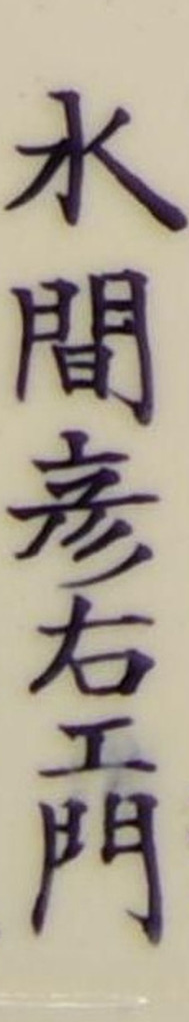水間彦右エ門
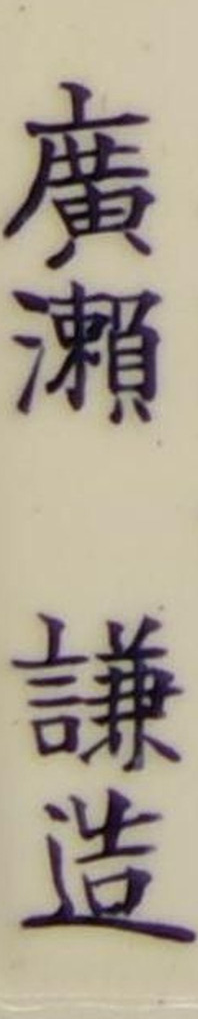廣瀬謙造

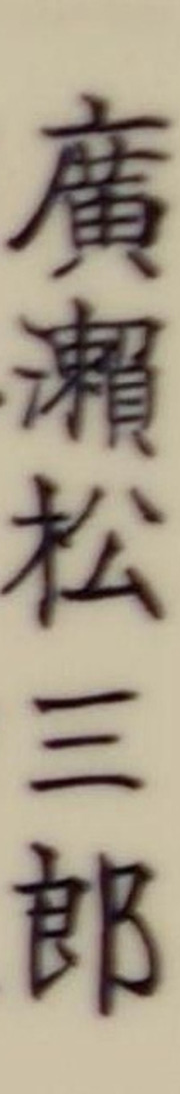広瀬松三郎
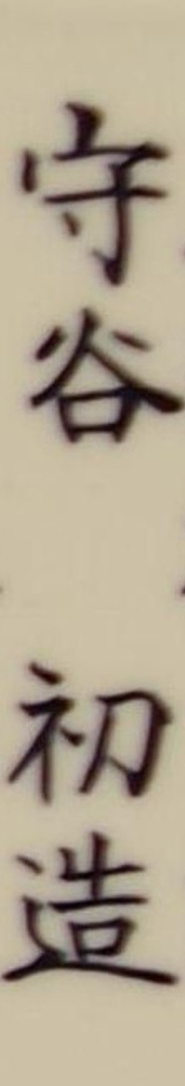守谷初造
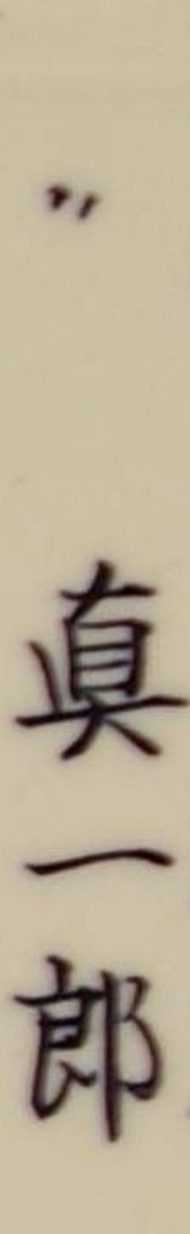真一郎
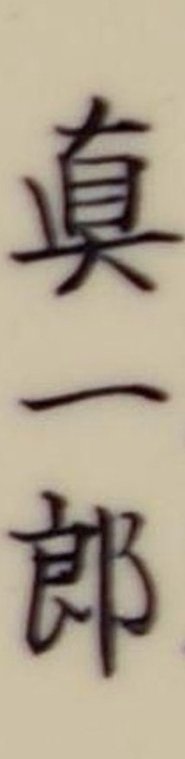真一郎
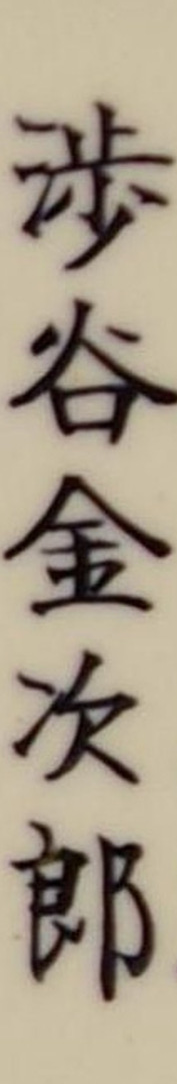渉谷金次郎
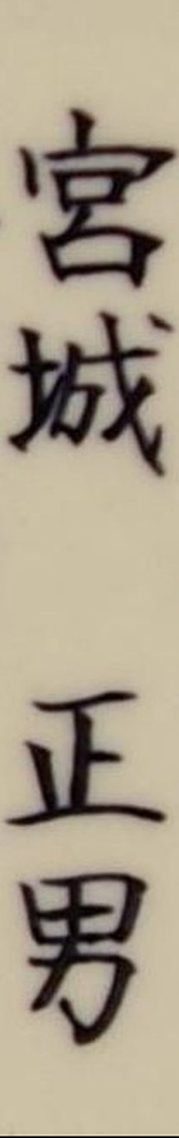宮城正男
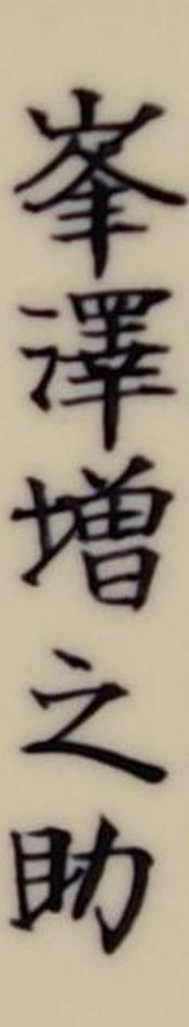峯澤増之助
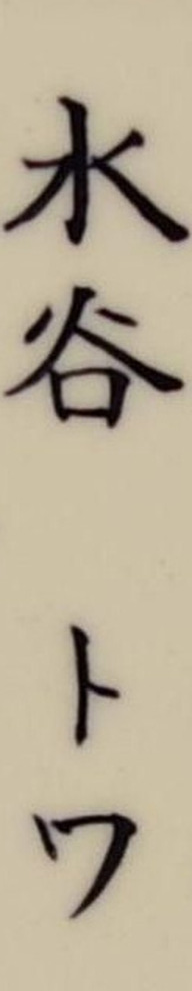水谷トワ
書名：E~L
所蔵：高野山金剛峯寺
